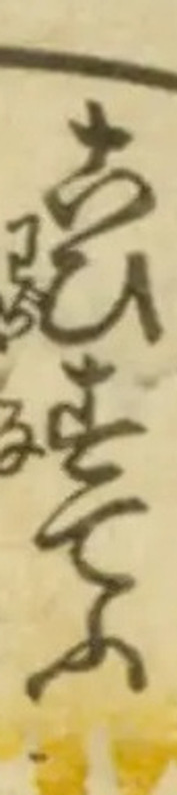こひすてふ
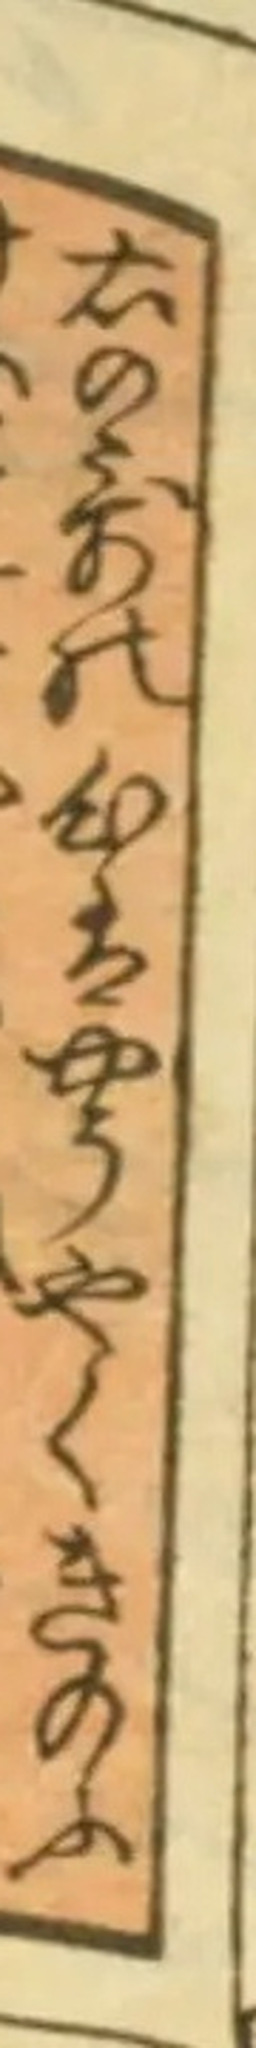右の歌の心はやうやくきのふ
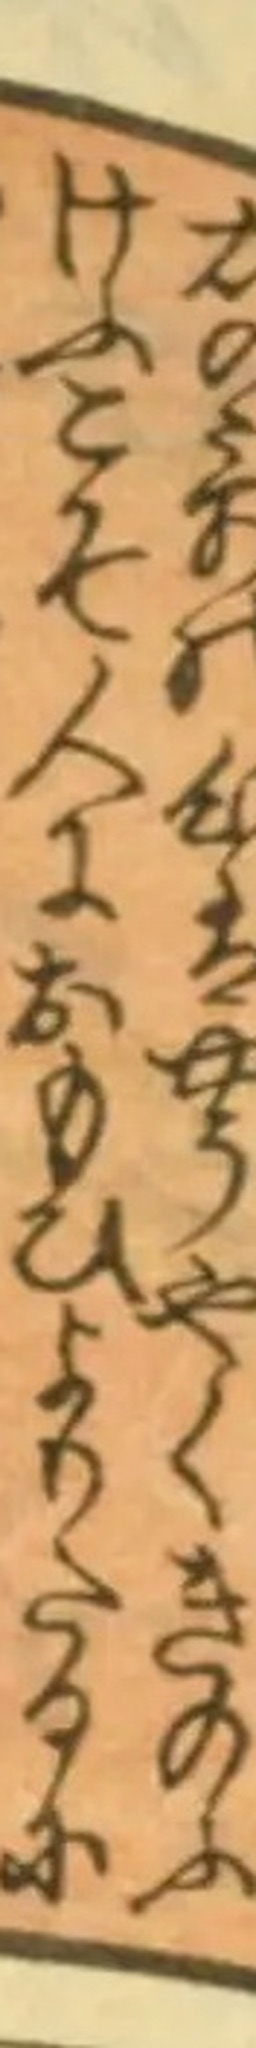けふこそ人におもひよりたるに
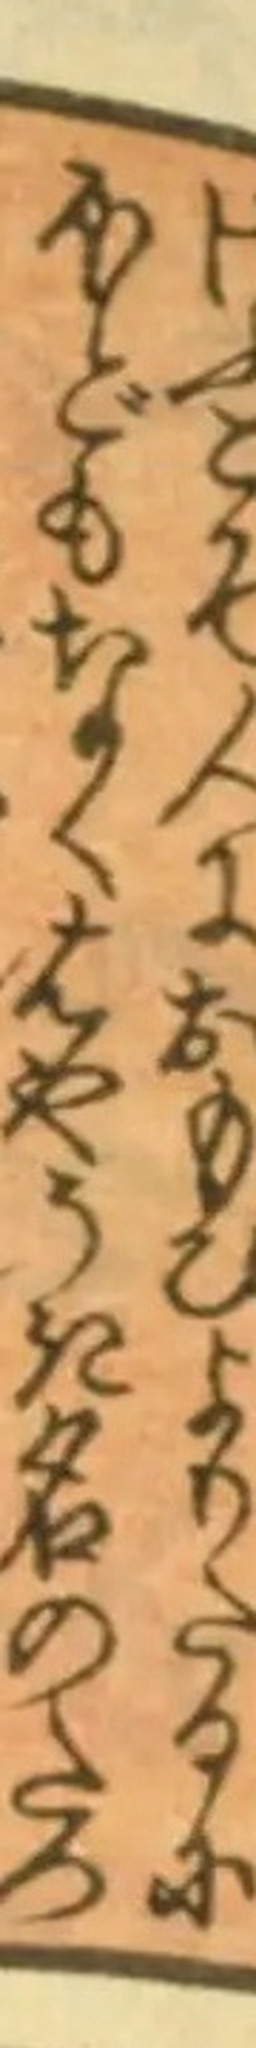ほどもなくはやうき名のたつ
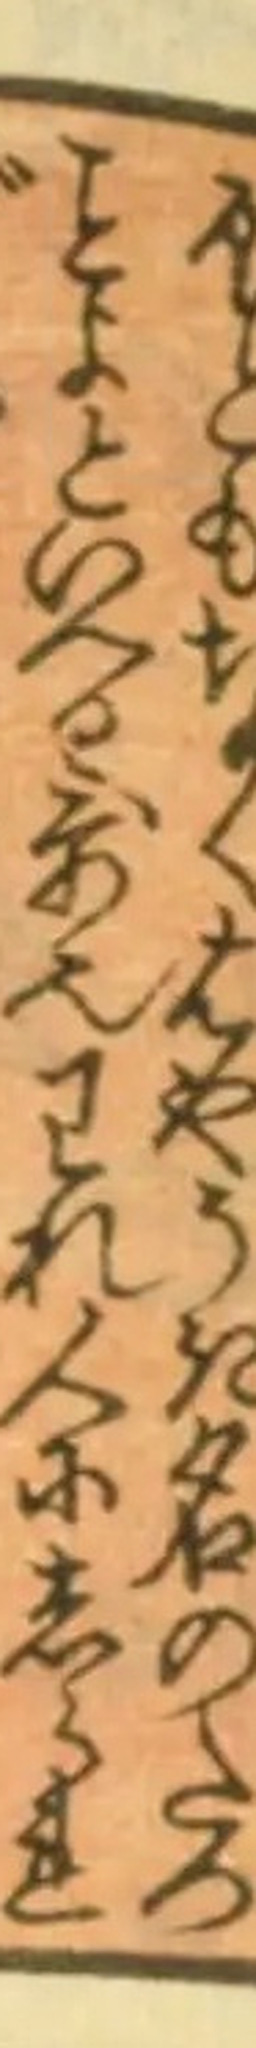ことよといへる歌也われ人にしられ
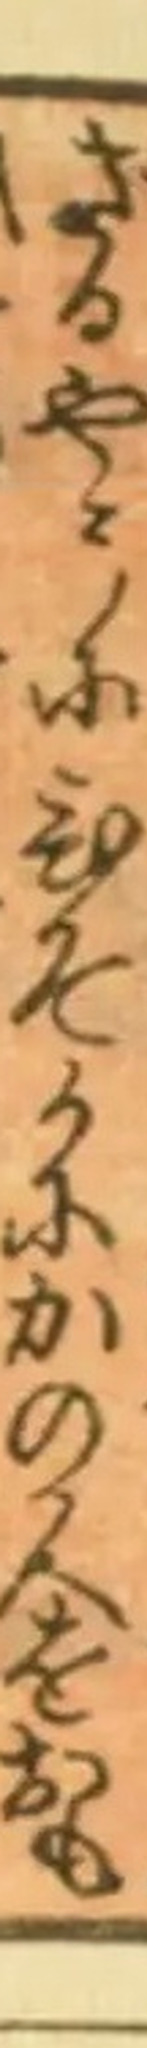ざるやうにひそかにかの人をおも
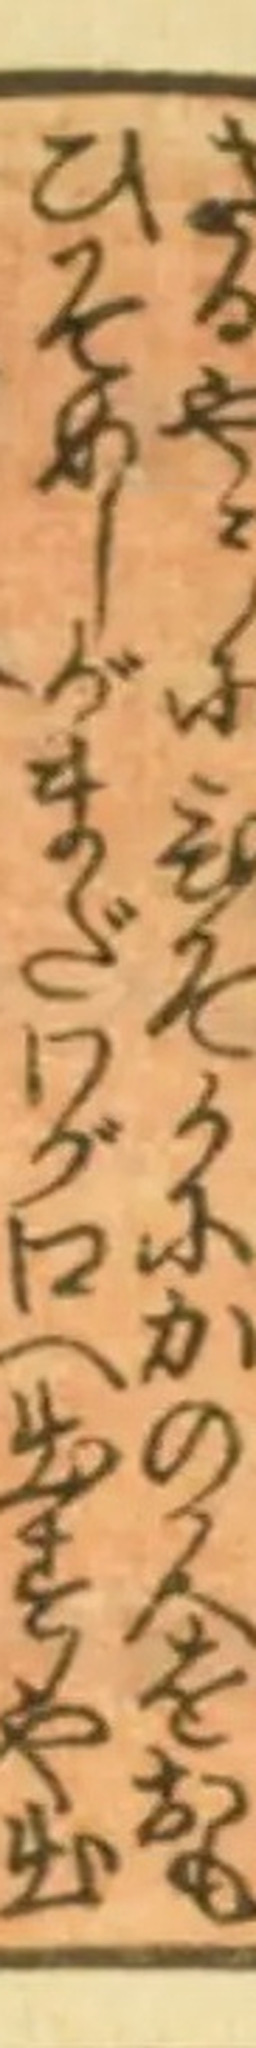ひそめしがまだわが口へ出すや出
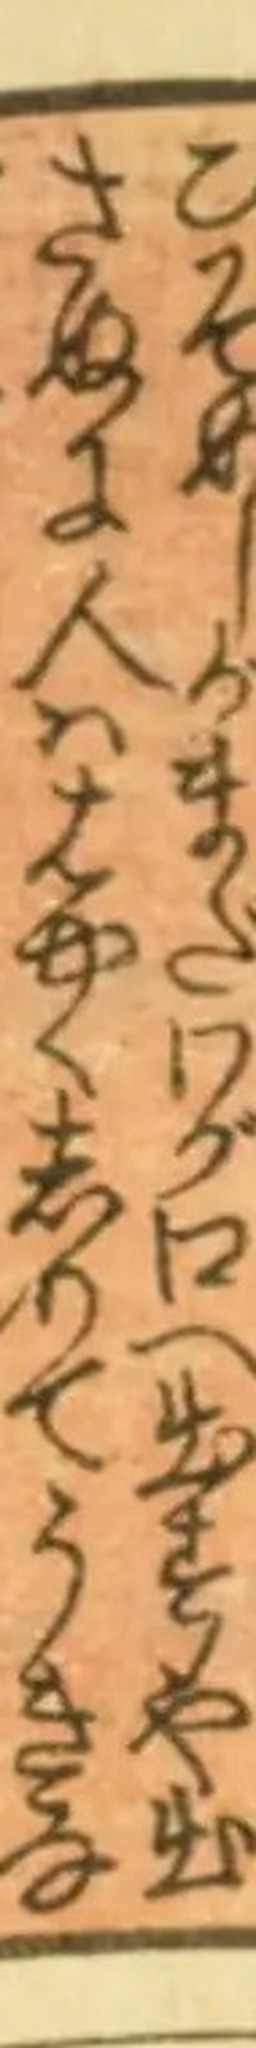さぬに人ははやくしりてうきな
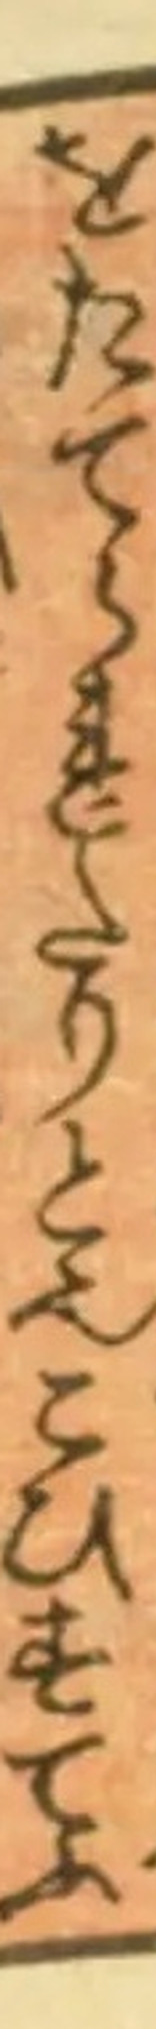をたてられたりとなりこひすてふ
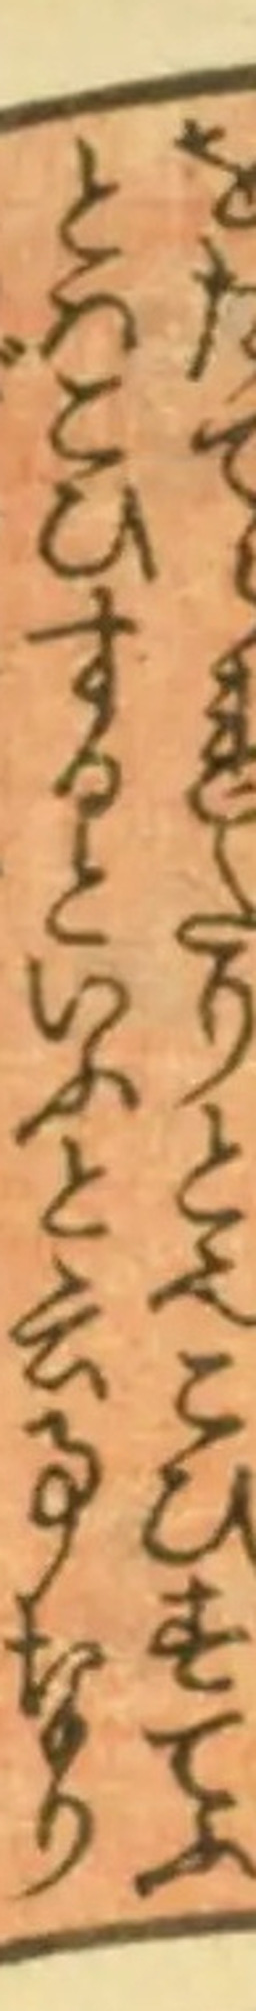とはこひするといふと云事なり
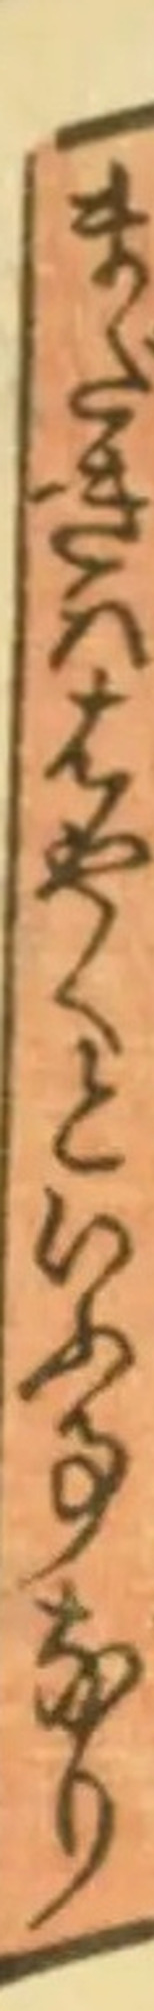まだきははやくといふ事なり
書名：四十一ばん　壬生忠見
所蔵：国立国会図書館 National Diet Library, JAPAN
